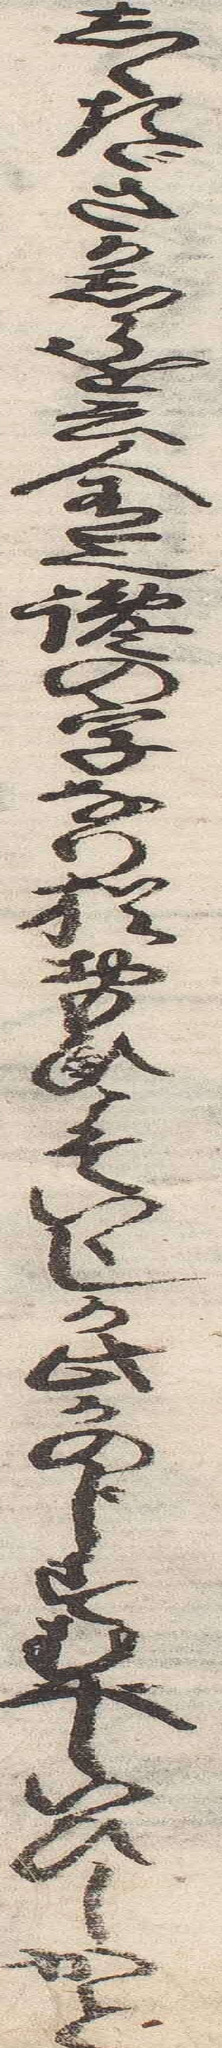しゝたゞさかしらを云人有也讒の字なり猶おもひこそいゝしか此かのじすむべしいひしかと
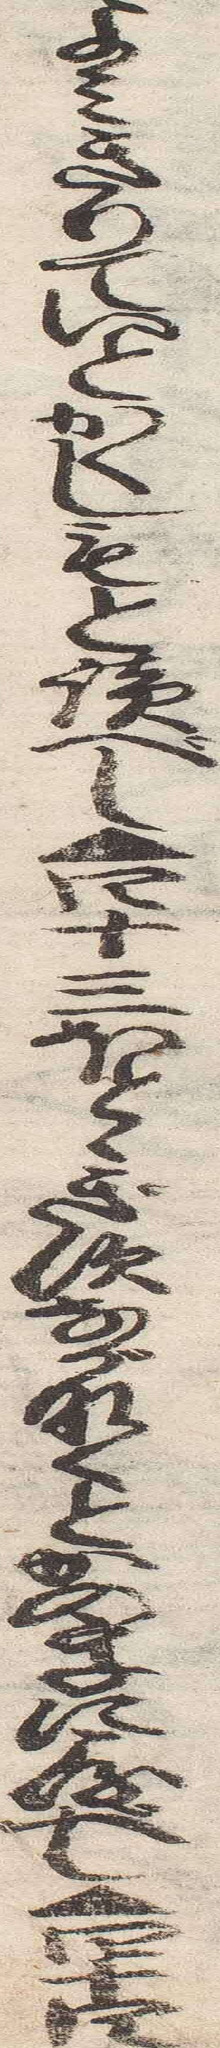よみきりていとかくしもと読べし▲四十三ほとゝぎすながなくとかの字にこるべし▲四十四
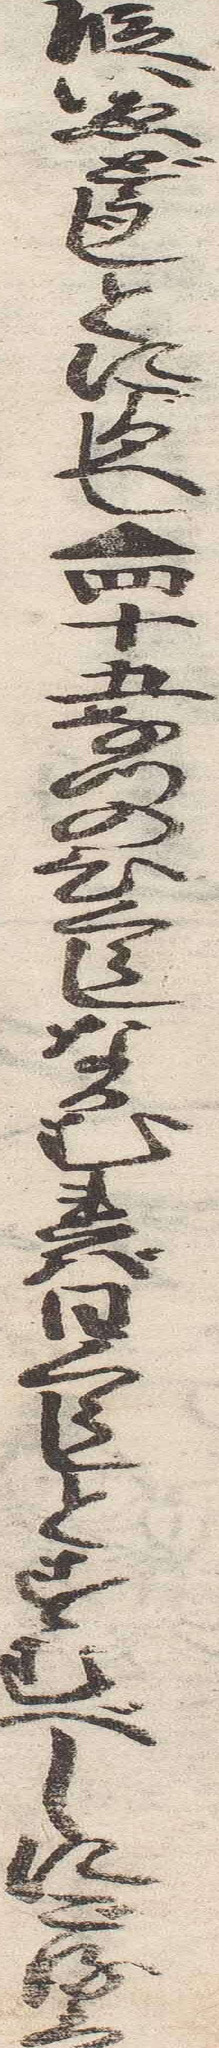段いゑどうじとにこるへし▲四十五なつのひくらしなかむれば日くらしとすむべしにごるは
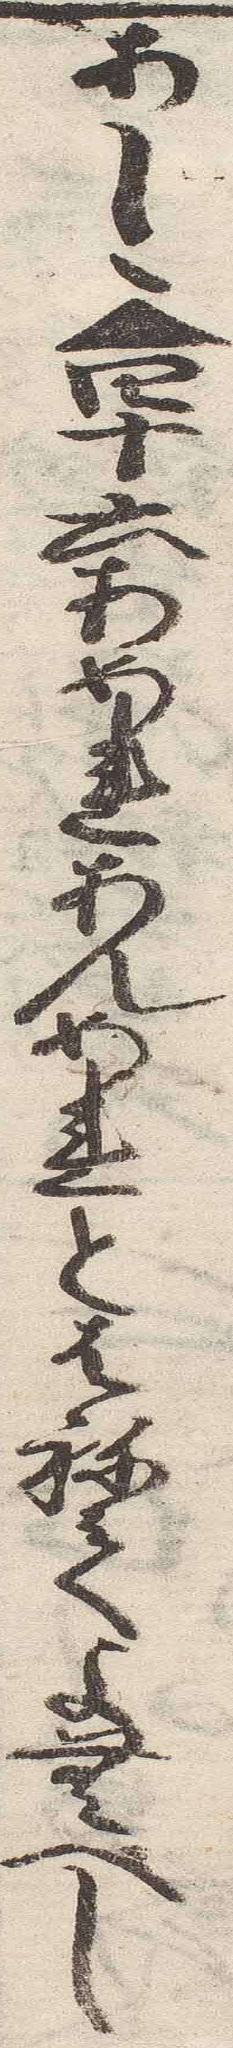あしゝ▲四十六あめれあんめれとはねてよむべし
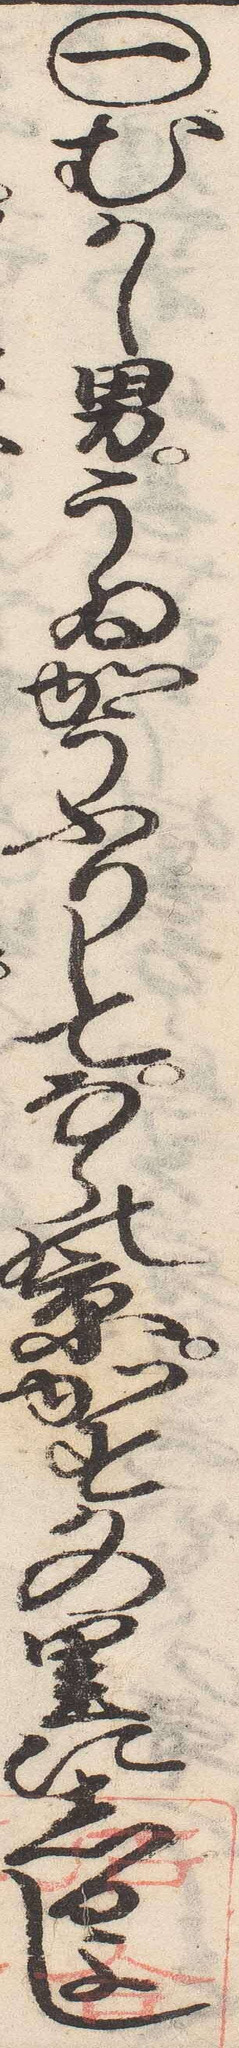㊀むかし男。うゐかうふりして。ならの京。かすかの里にしるよし
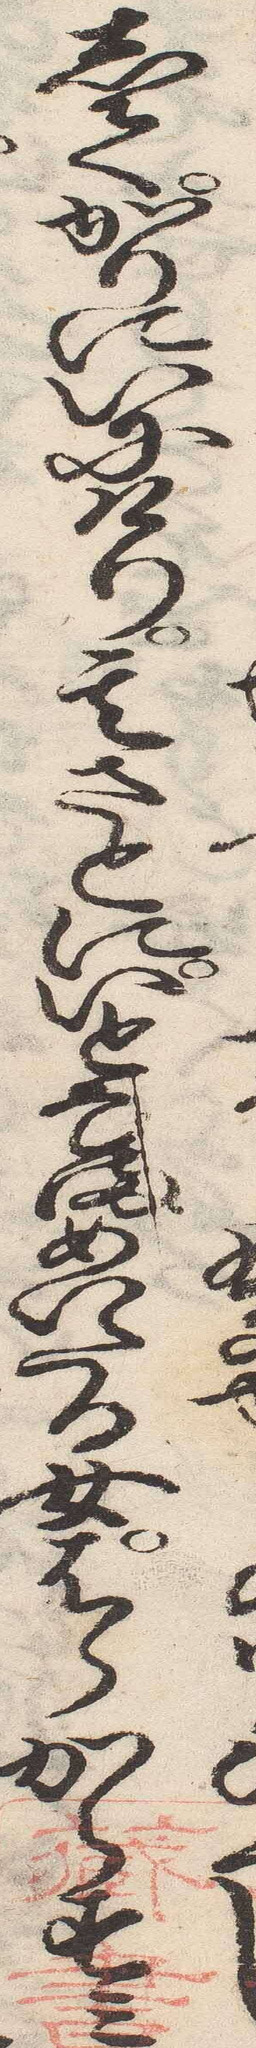して。かりにいにけり。其さとに。いとなまめいたる女。はらからすみ
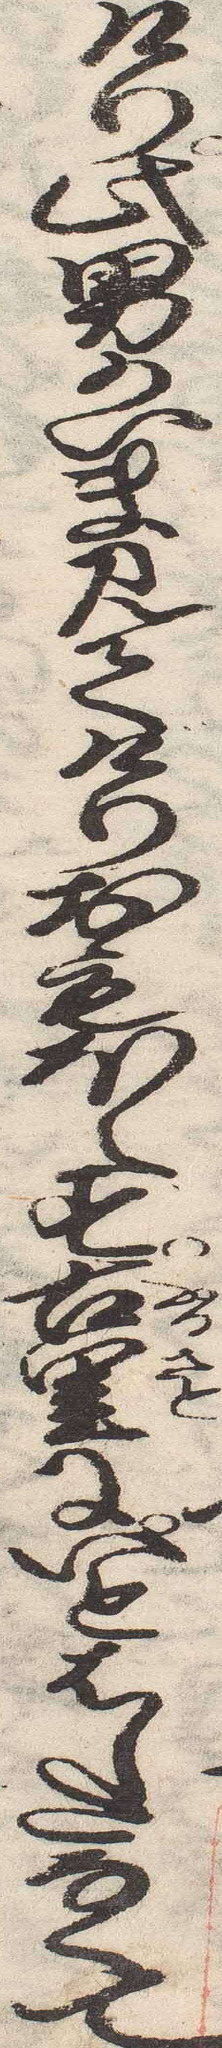けり。此男かいま見てけりおもほえす。古里に。いとはしたなくて
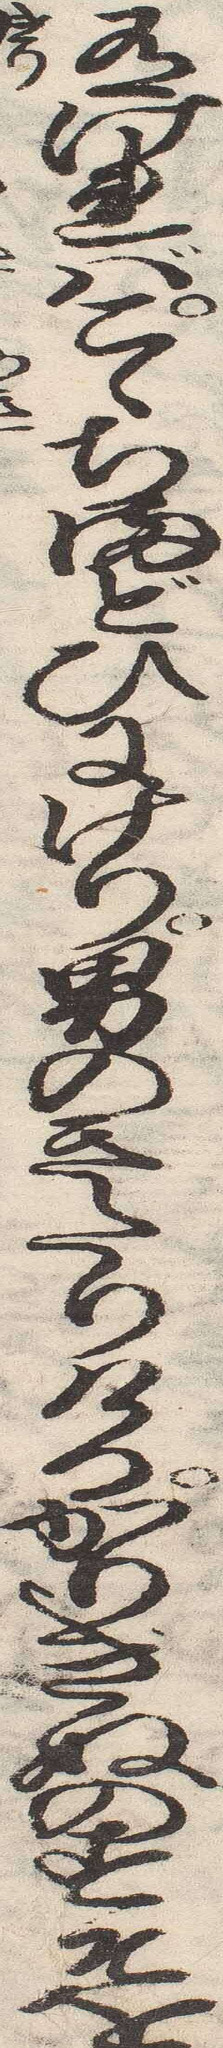有ければ。こゝちまどひにけり。男のきたりける。かりきぬのすそを
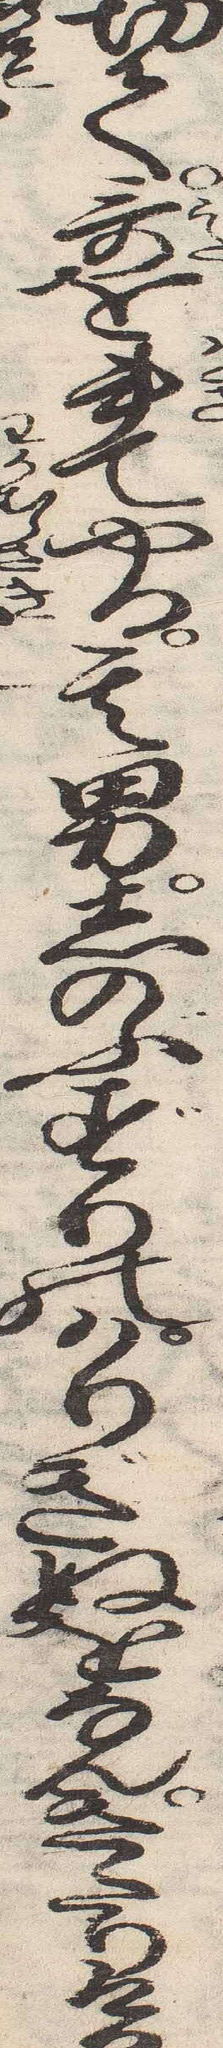切て。哥を書てやる。其男。しのぶずりの。かりぎぬをなん。きたりける
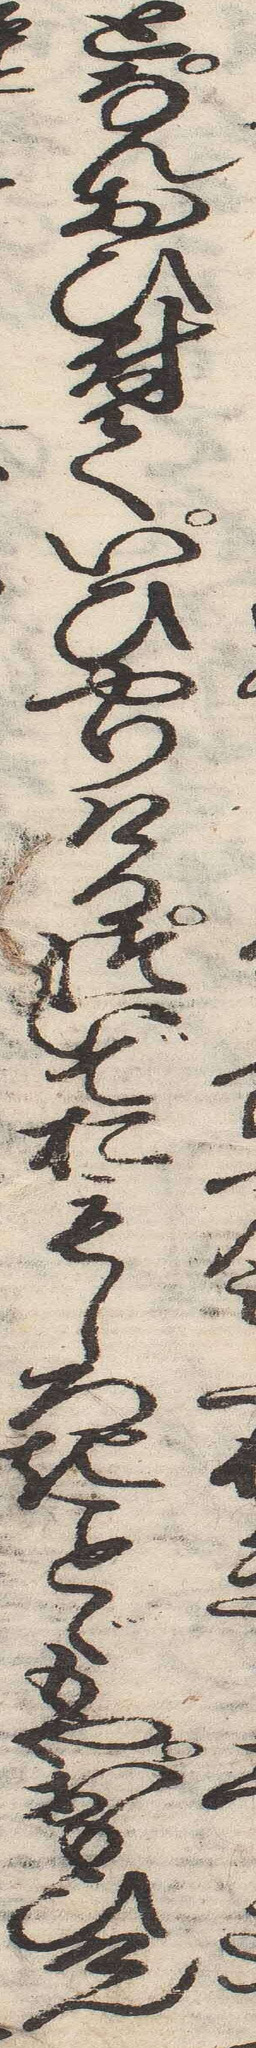と。なんおひ付て。いひやりける。ついでおもしろきことゞもや。おもひけん
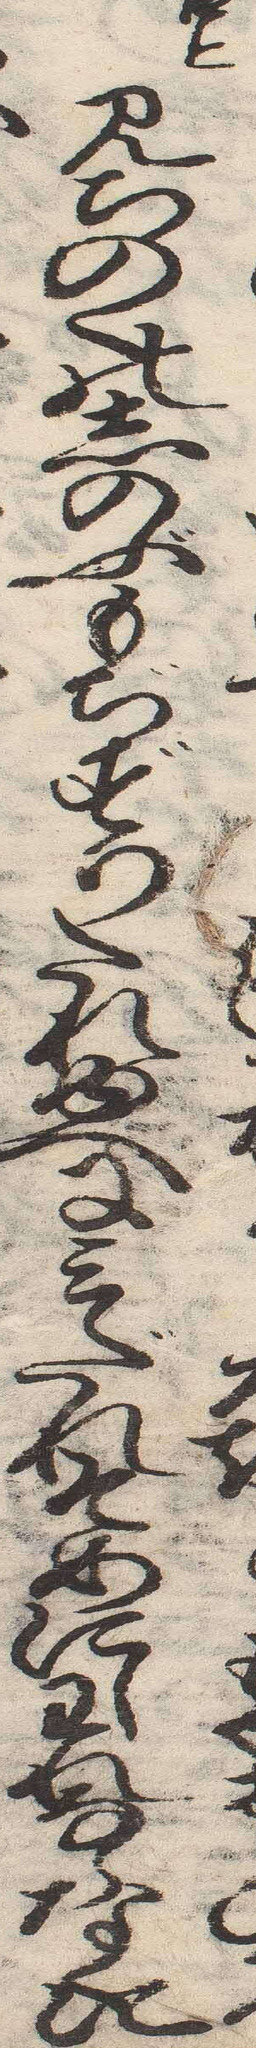古今みちのくのしのぶもぢずりたれゆへにみだれそめにしわれならなくに
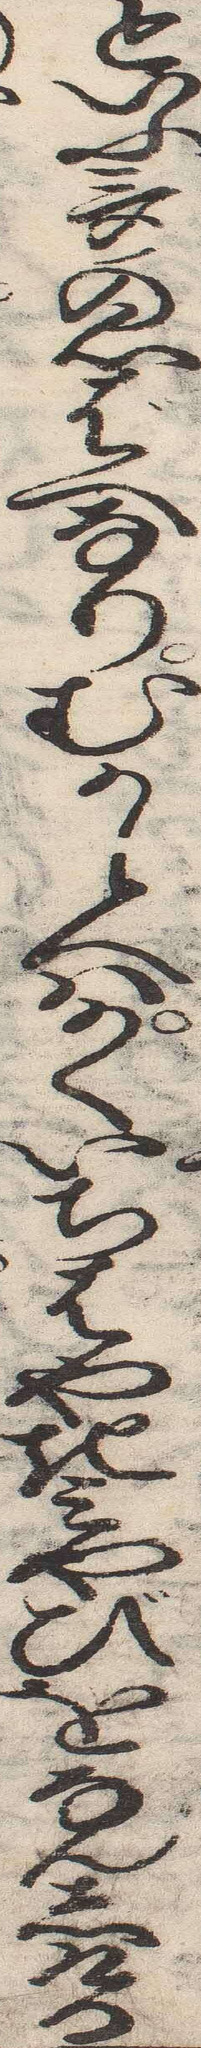といふ哥の心ばへなり。むかし人は。かくいちはやきみやびをな
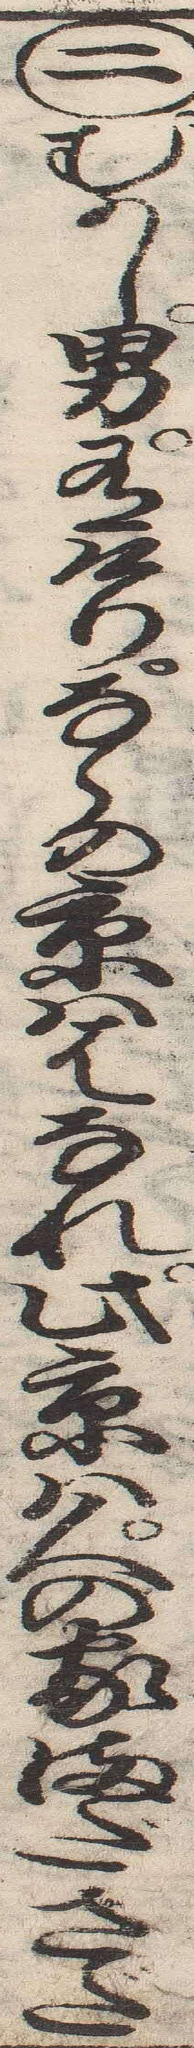㊁むかし。男。有けり。ならの京ははなれ。此京は。人の家まださだ
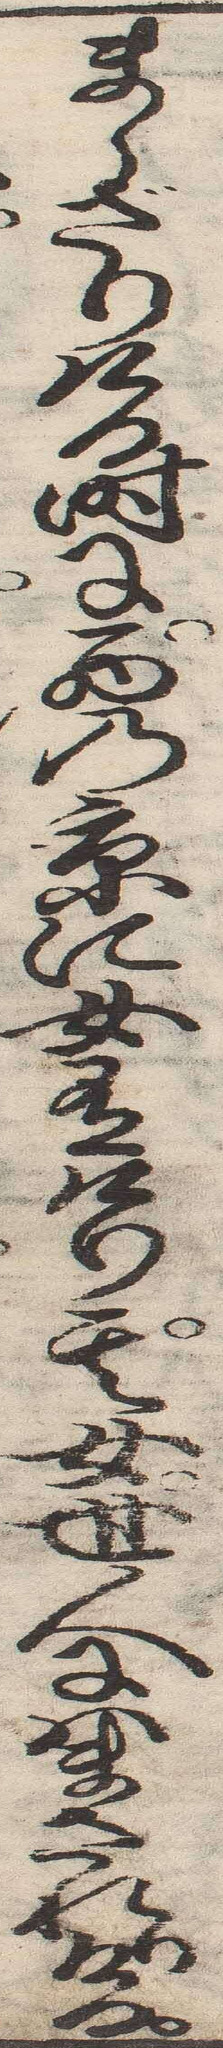まらざりける時に。西の京に女有けり。其女。世人にはまされりける。
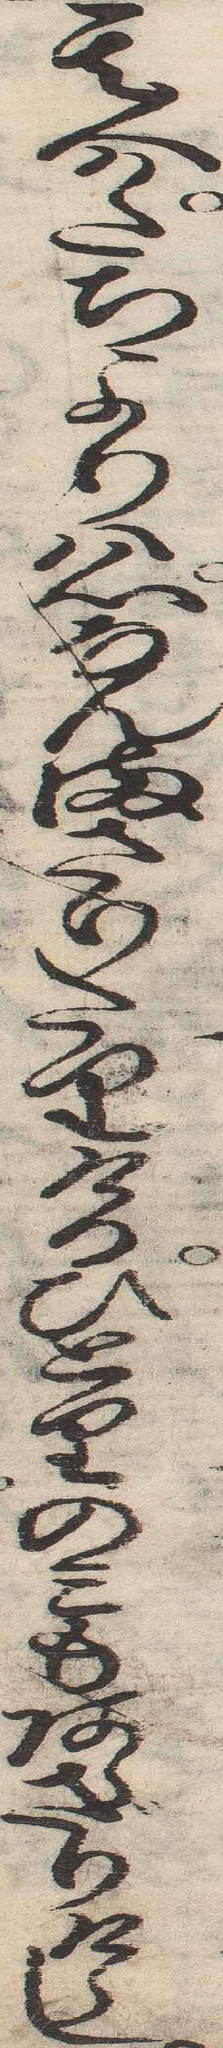其人。かたちよりは。心なんまさりたりける。ひとりのみもあらざりけらし。
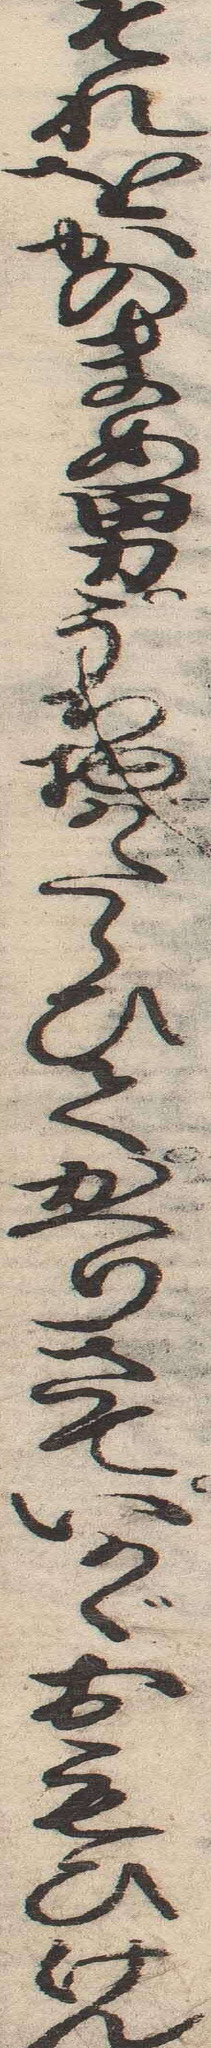それをかのまめ男。うち物かたらひて。かへりきて。いかゞおもひけん
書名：伊勢物語
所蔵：東京学芸大学附属図書館 国文学研究資料館
